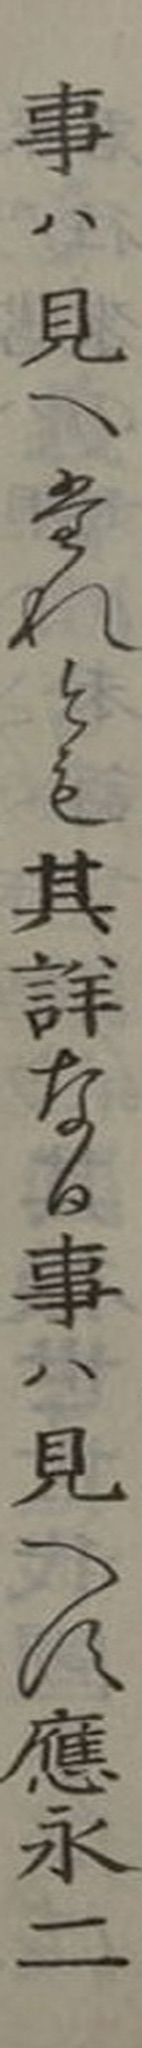事ハ見へたれとも其詳なる事ハ見へす應永二
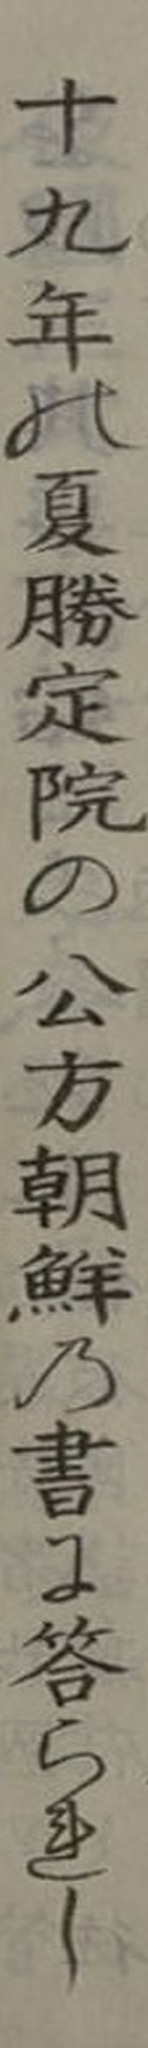十九年の夏勝定院の公方朝鮮の書に答られし

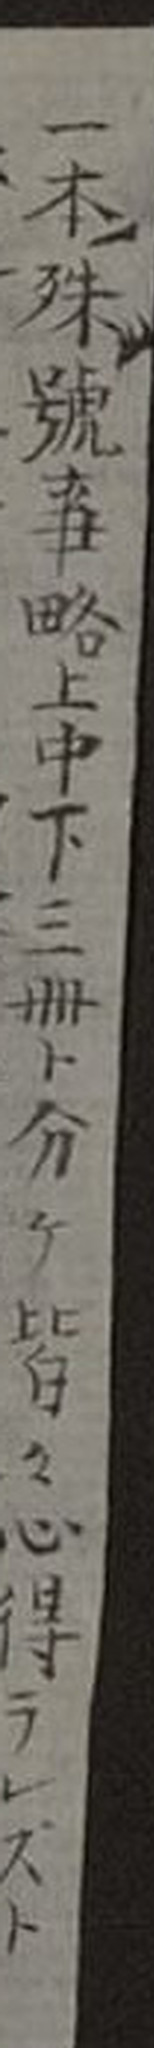一本殊號事略上中下三冊ト分ケ皆々心得ラレズト
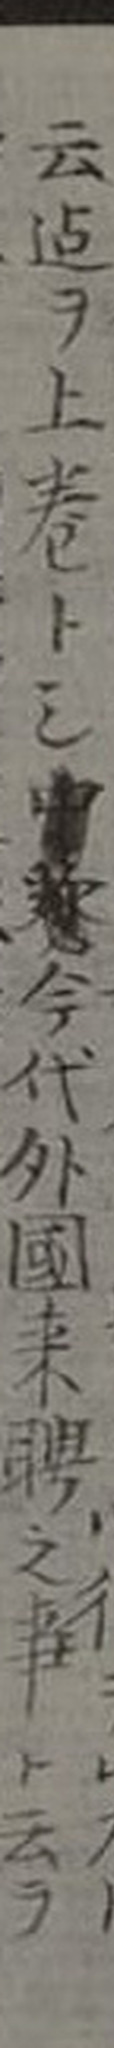云迠ヲ上巻トシ今代外國来聘之事ト云ヲ
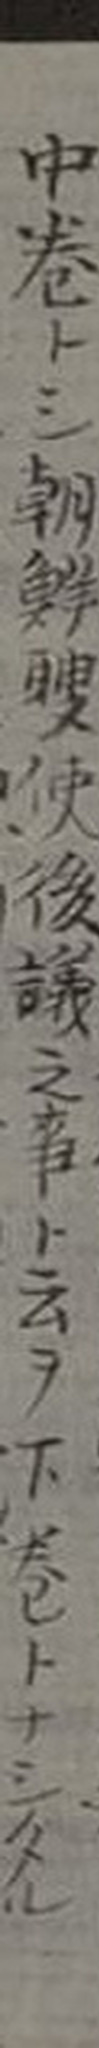中巻トシ朝鮮聘使後議之事ト云ヲ下巻トナシタル
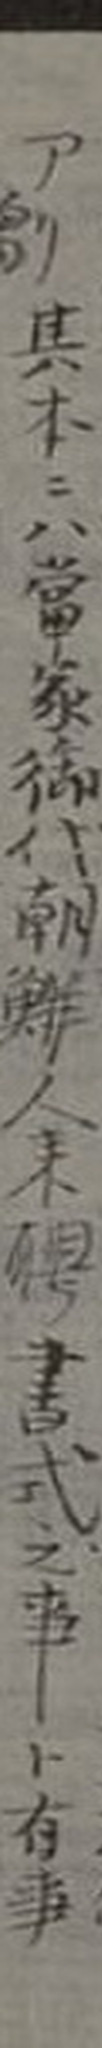アリ其本ニハ當家御代朝鮮人来聘書式之事ト有事
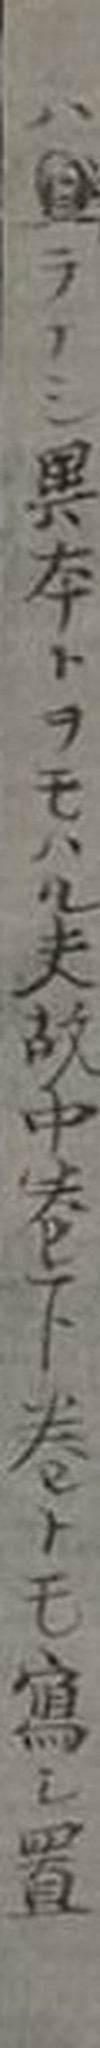ハ曽ヲナシ異本トヲモハル夫故中巻下トモ寫シ置
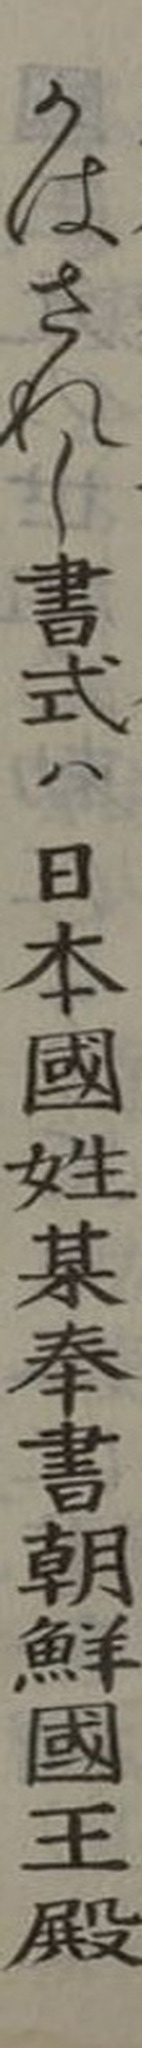かはされし書式ハ日本國姓某奉書朝鮮國王殿
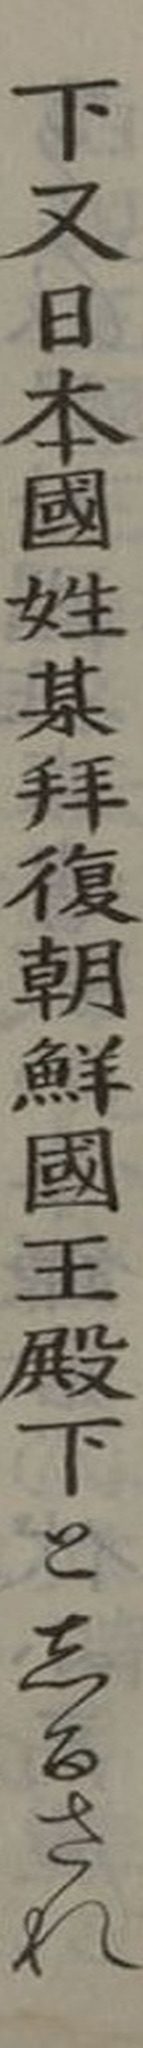下又日本國姓某拝復朝鮮國王殿下としるされ
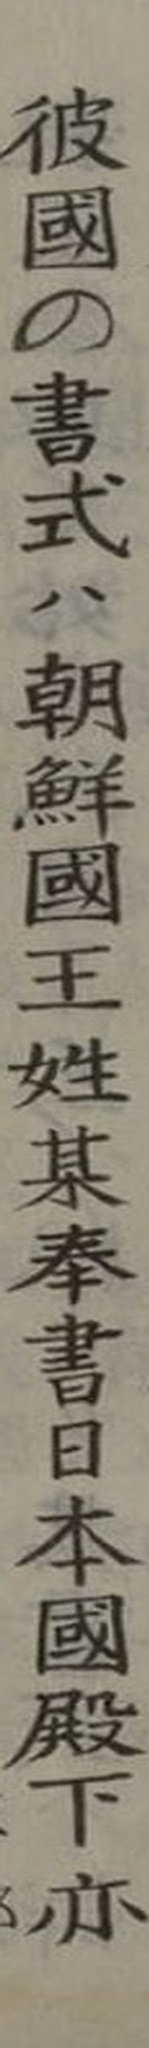彼國の書式ハ朝鮮國王姓某奉復日本國殿下亦
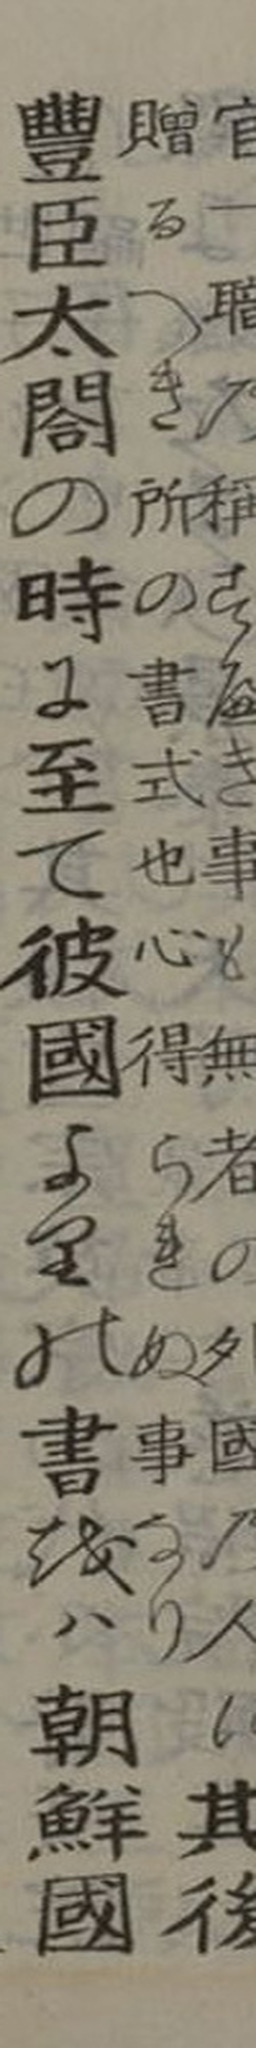豐富太閤の時に至て彼國よりの書をハ朝鮮國
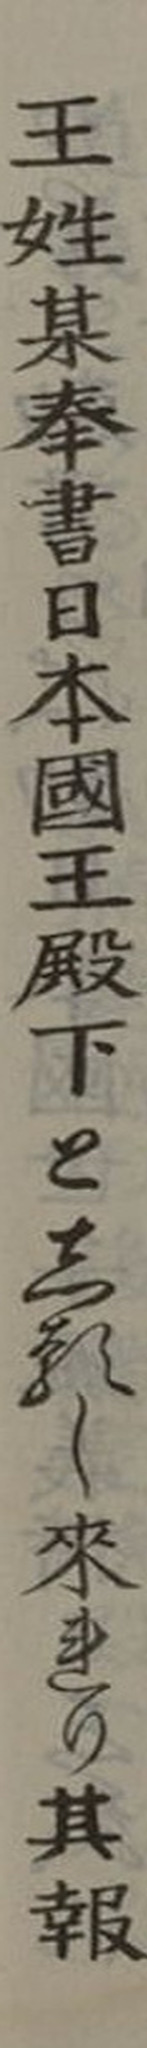王姓某奉書日本國王殿下としるし來れり其報
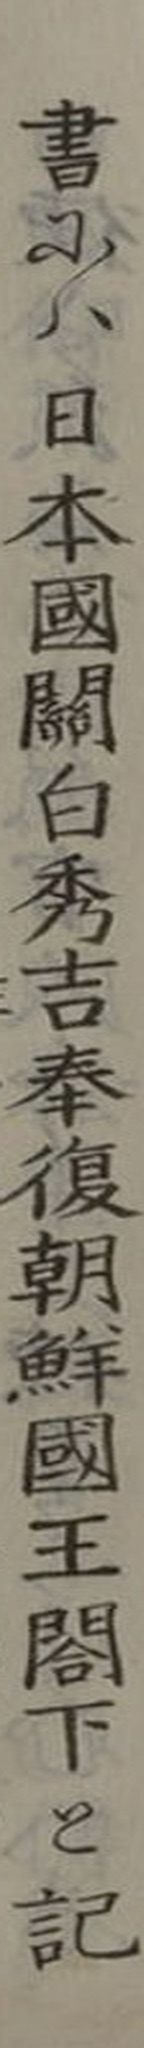書にハ日本國關白秀吉奉復朝鮮國王閤下と記
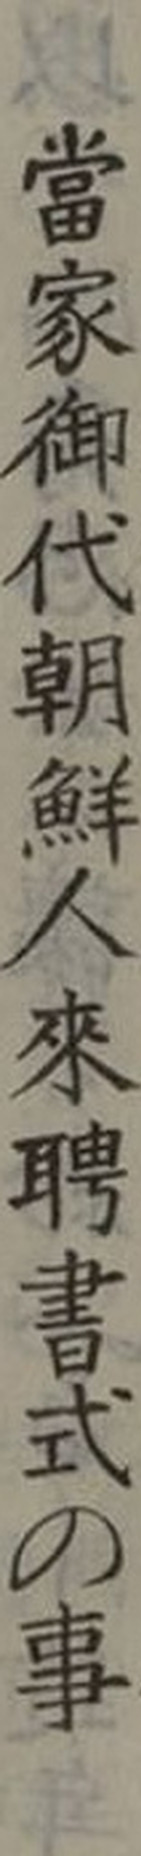當家御代朝鮮人來聘書式の事
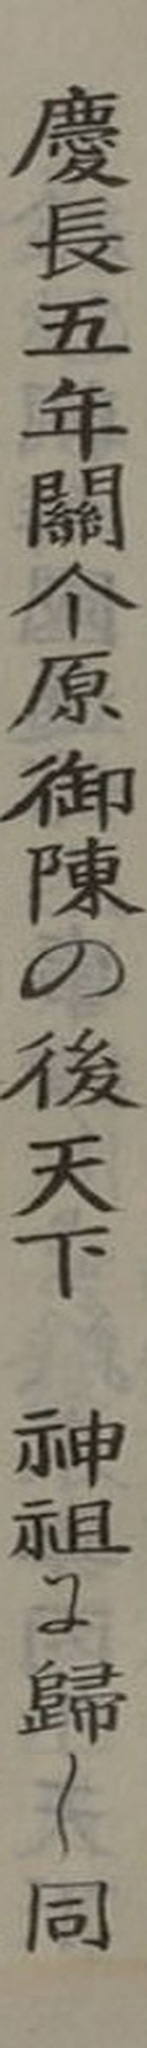慶長五年關个原御陳の後天下神祖に歸し同
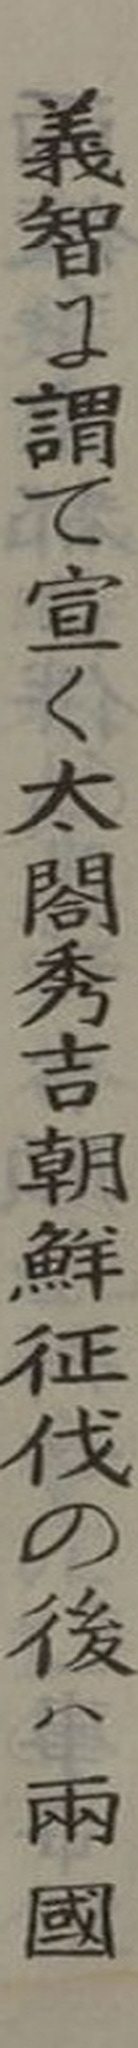義智に謂て宣く太閣秀吉朝鮮征伐の後ハ兩國
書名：骨董録
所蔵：University of the Ryukyus Library
